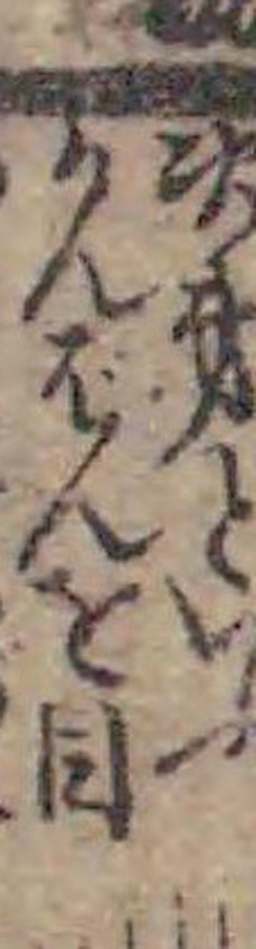かんばんを目
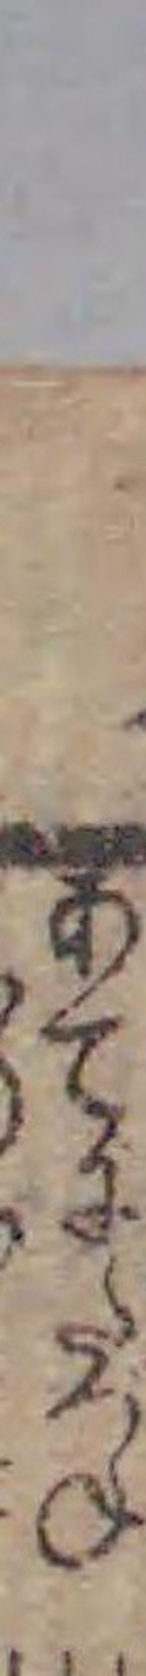あてにたづね
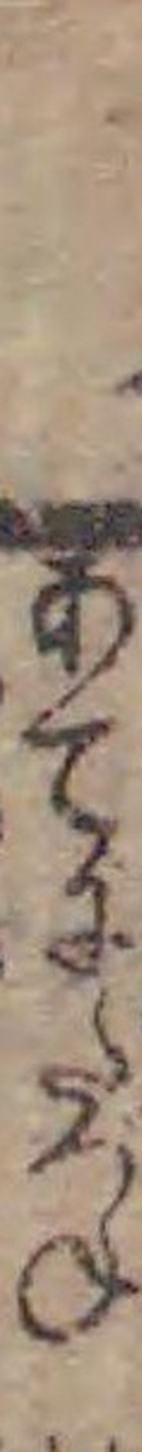あてにたづね
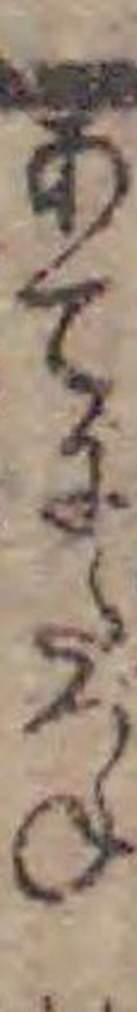あてにたづね
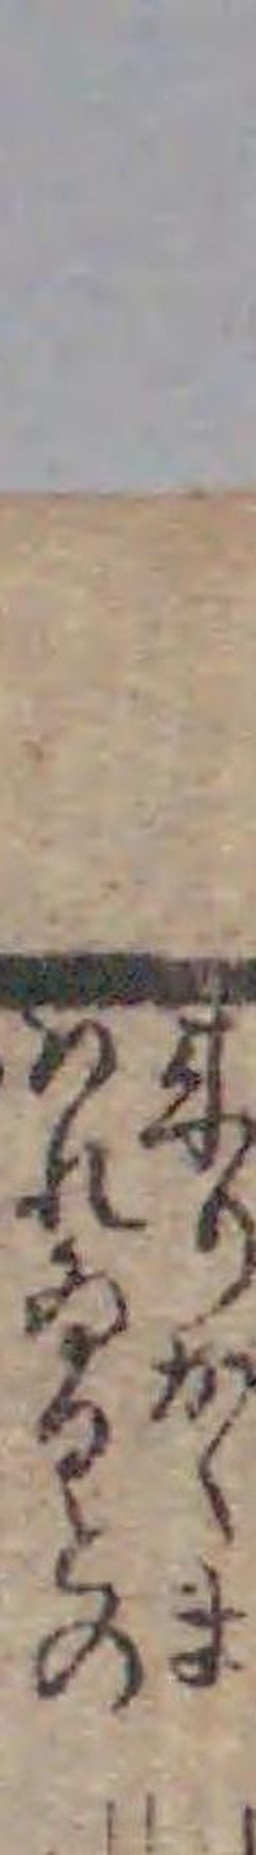はれゐるとの
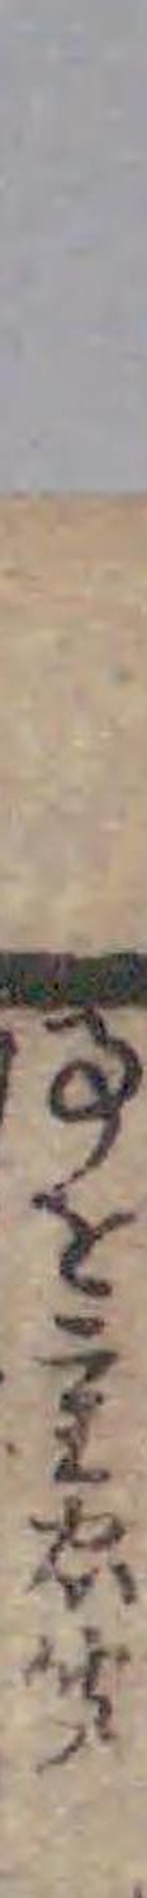事を重忠聞
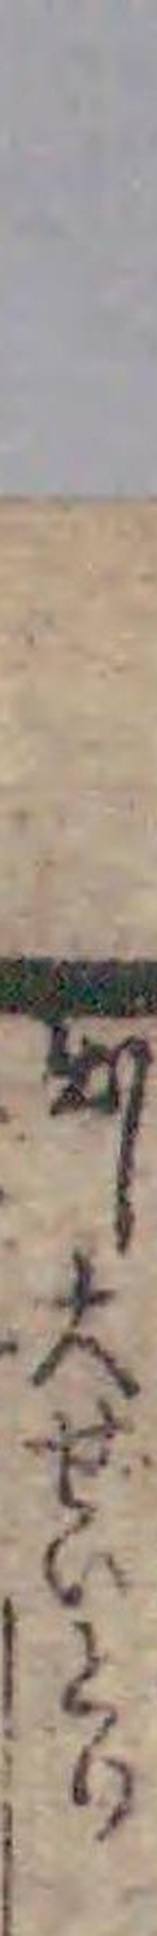出し大ぜいとり
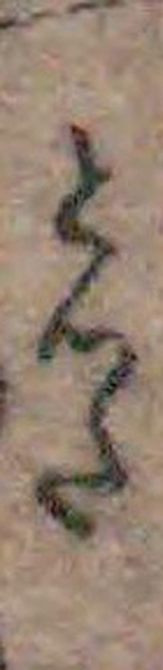とつた
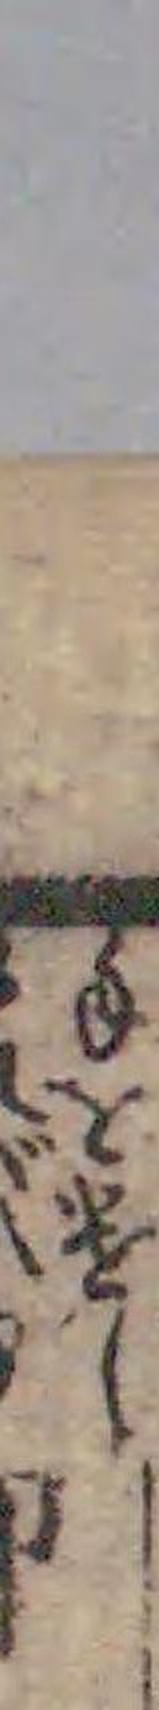手を遣し
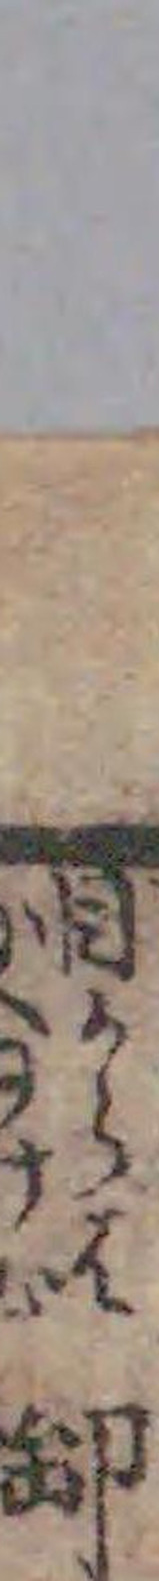目かしらは
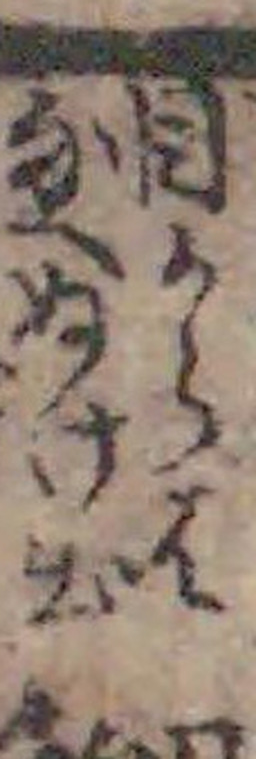はへぬけ出
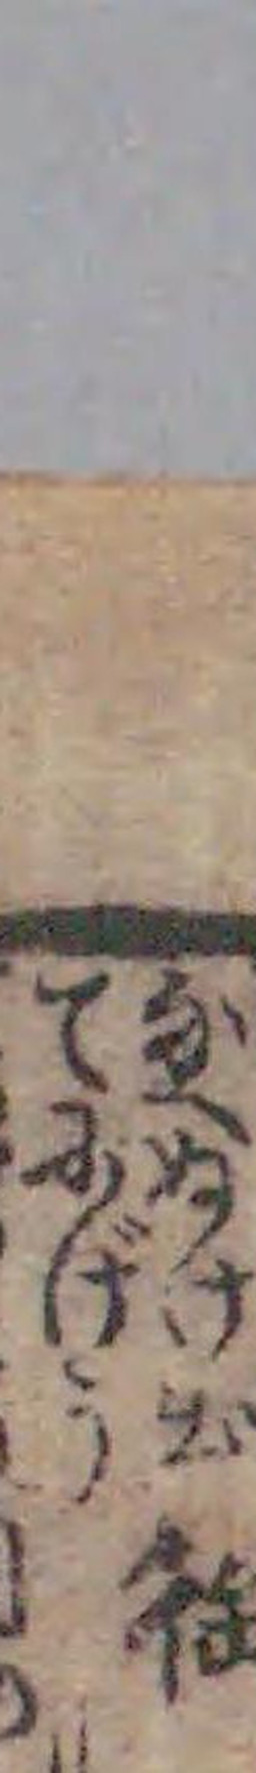てにげう
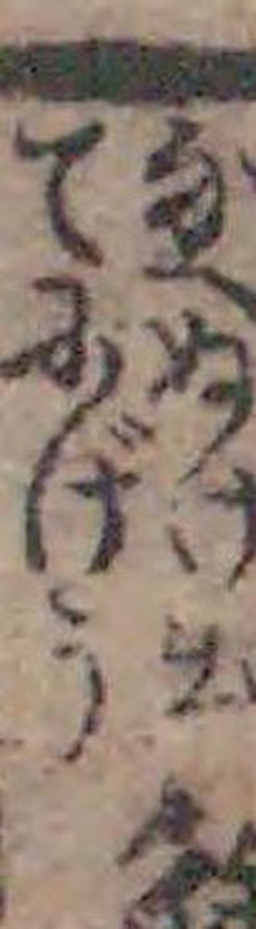てにげう
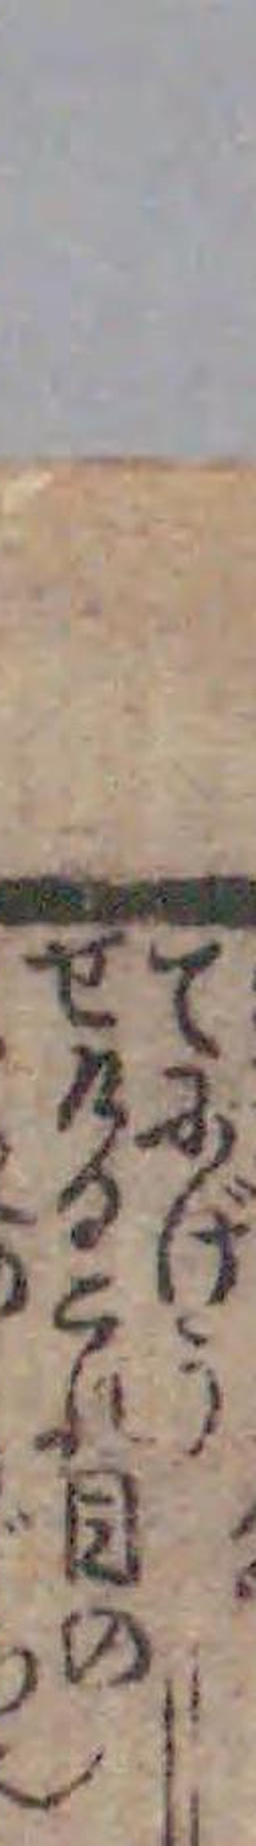せけるこれ目の
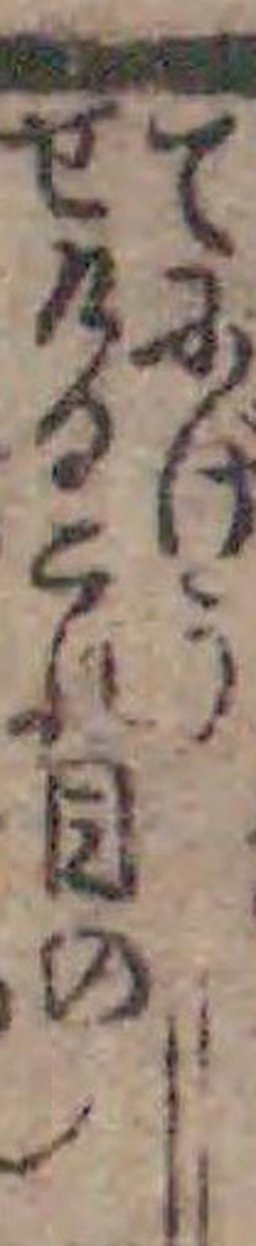せけるこれ目の
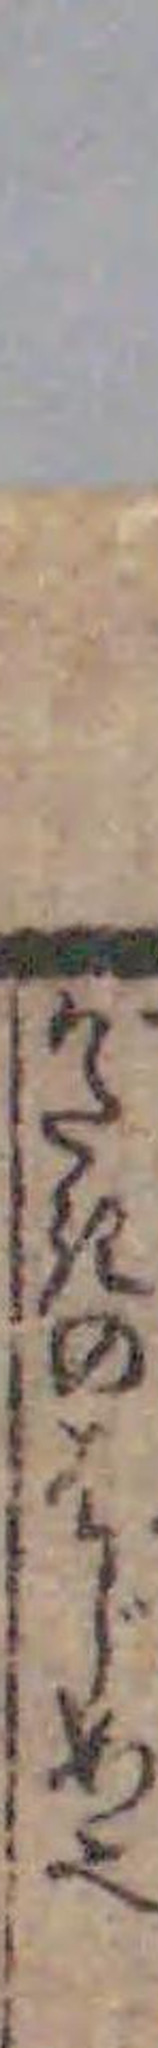かたきのはじめ也
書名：悪七変目景清 : 2巻
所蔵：国立国会図書館 National Diet Library, JAPAN
